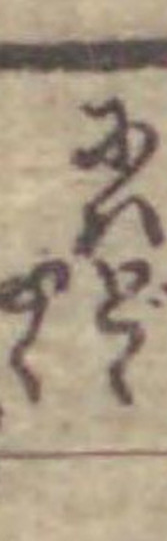にはどく
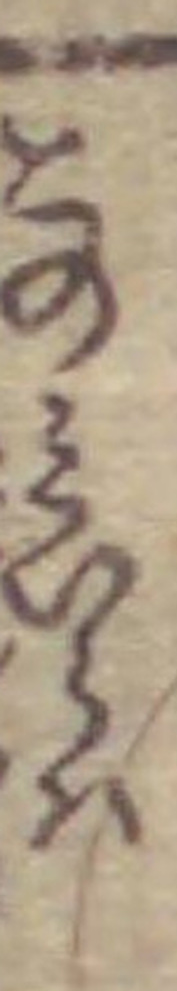このみいらは
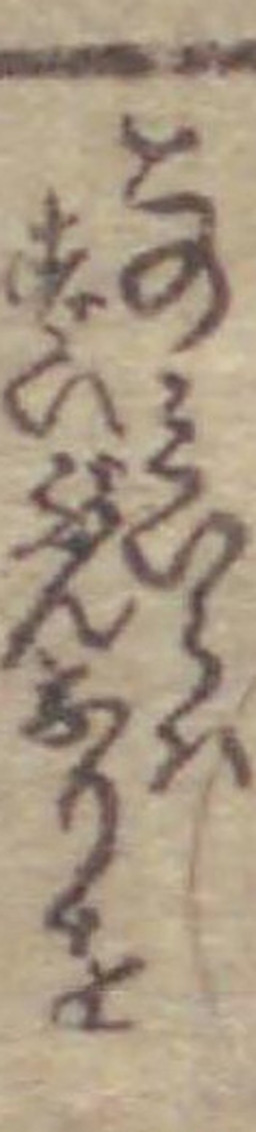ずいぶんおりを

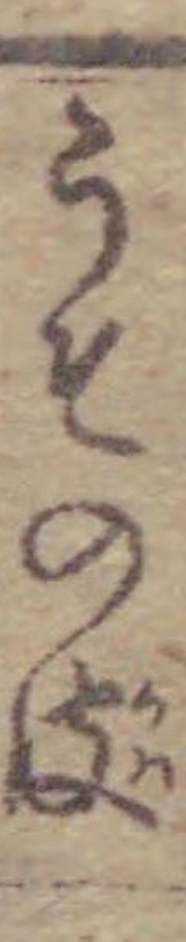うその皮
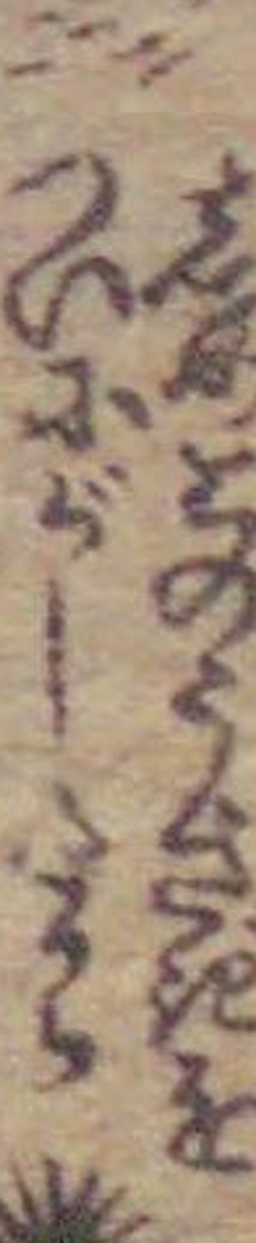ついにがしたから
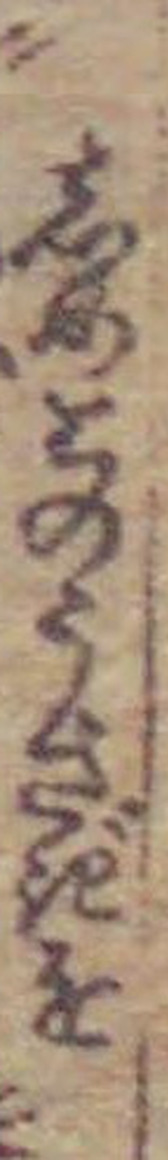しめこのうさぎを
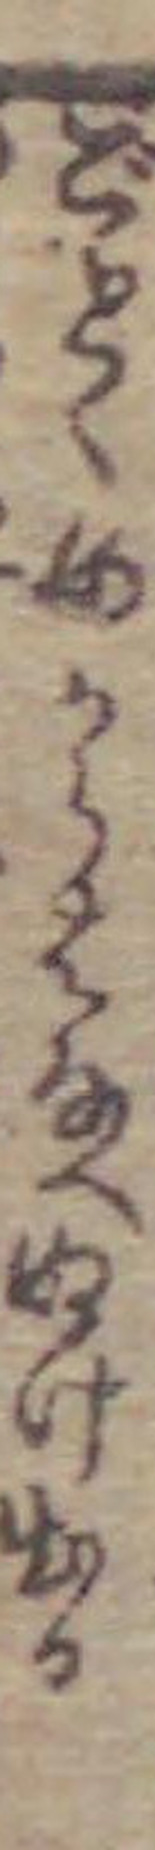ごとくめからはなへぬけ出る
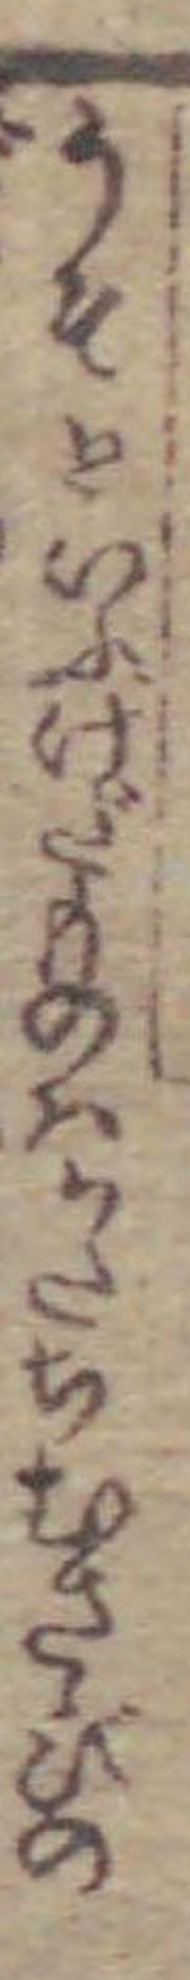うそといふけだものはかたちむさゝびの
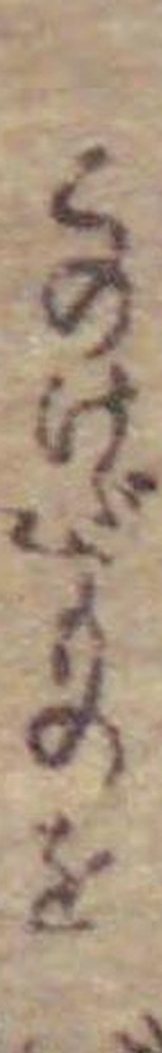このけだものを
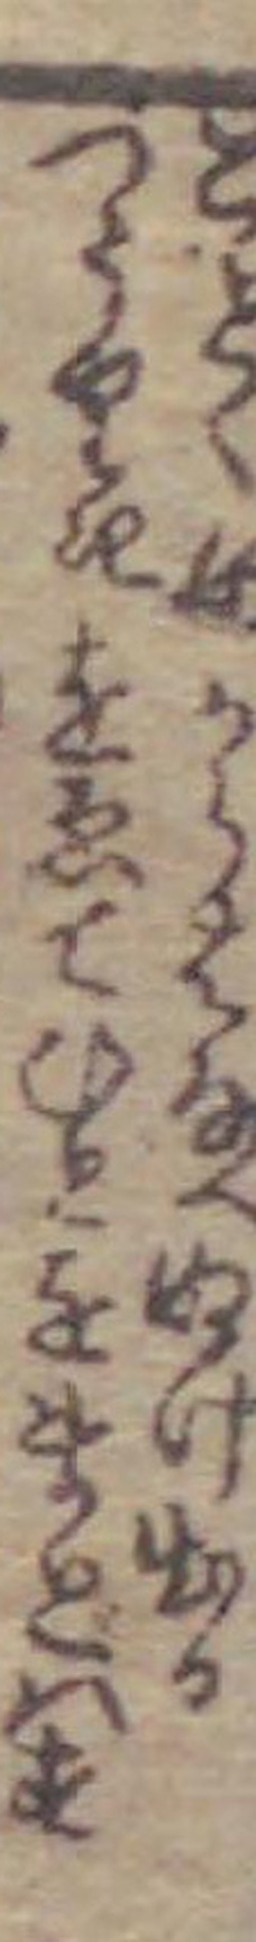つうりきをゑてひとをまどはす
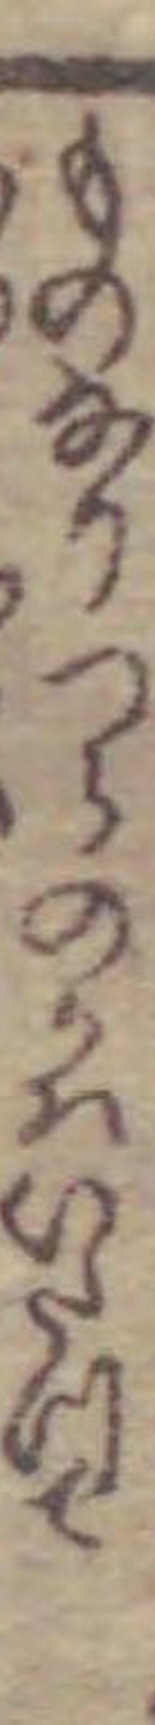ものなりつらのかわいたつて
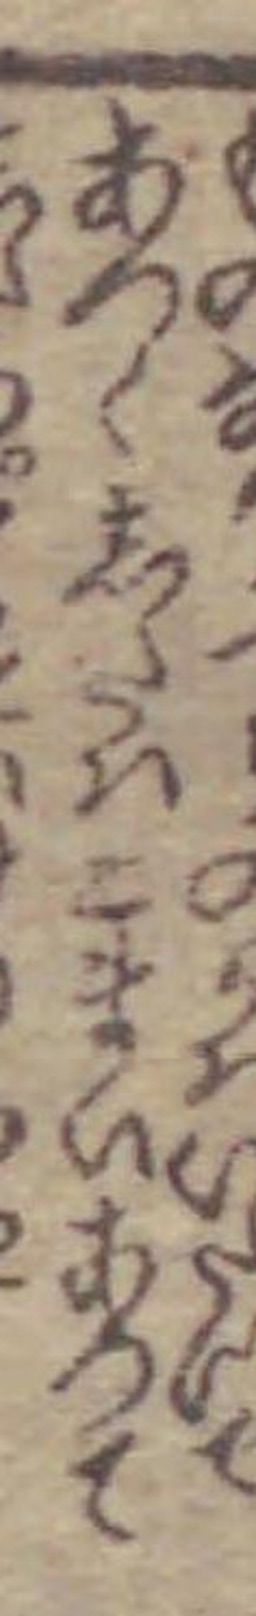あつくしたは二まいあつて
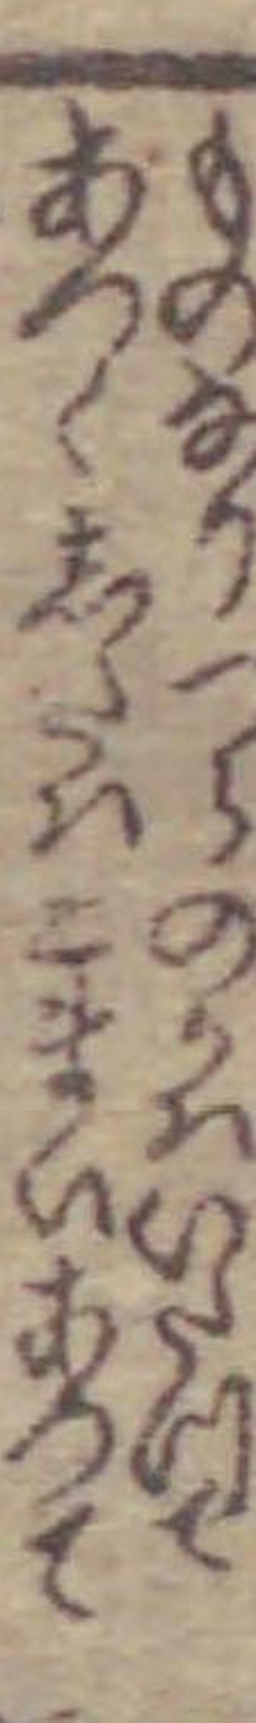あつくしたは二まいあつて
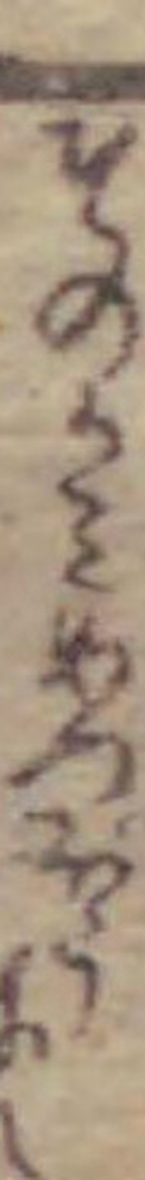そのかみめつぽう弥八
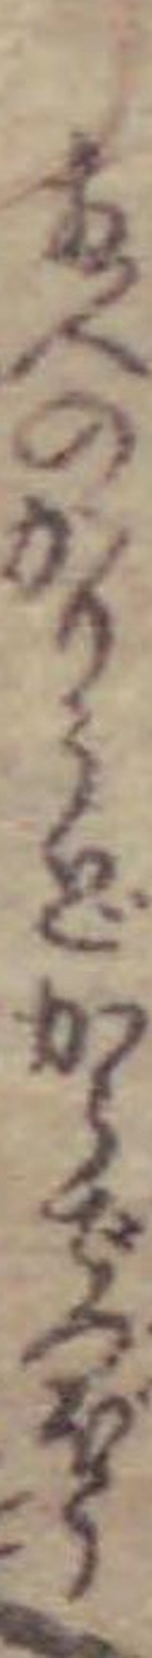両人のかりうどからでつぽうを
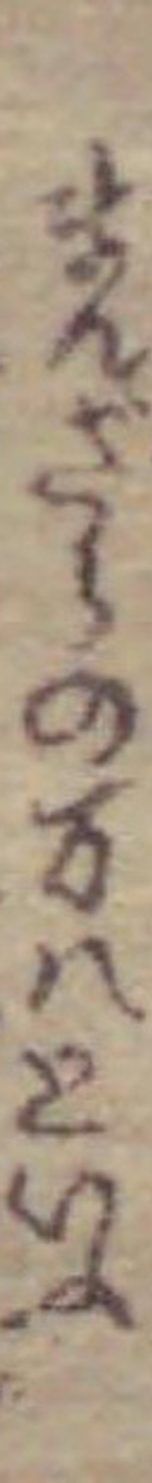まんざらの万八といふ
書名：化物和本草 : 3巻
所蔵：国立国会図書館 National Diet Library, JAPAN
